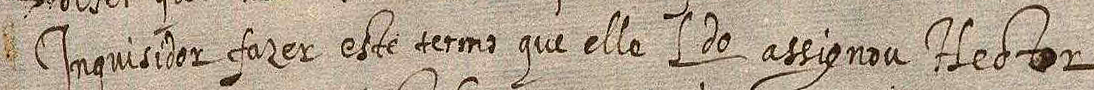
Jnquisidor fazer este termo que elle Ldo assignou Hector
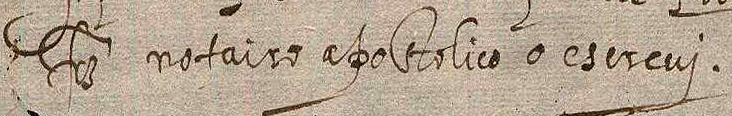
fr̄z notairo apostolico o escreuj.
